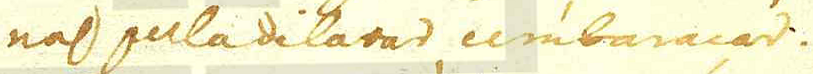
naõ pella dilatar, e embaraçar.
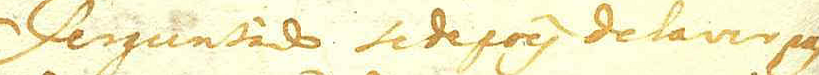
Perguntádo se depoēs de la ver pas
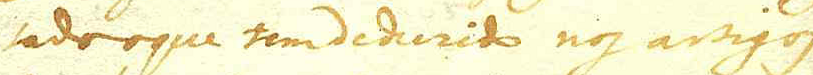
sado o que tem deduzido nos artigos
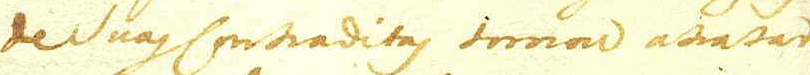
de Suas Contraditas tornou a tratar
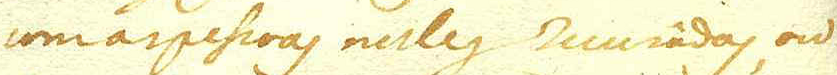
com as pessoas nelles recuzâdas, ou
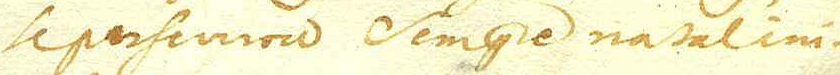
se perseverou Sempre na tal ini
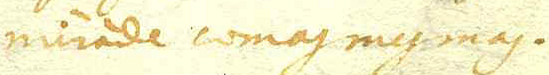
mizáde com as mesmas.
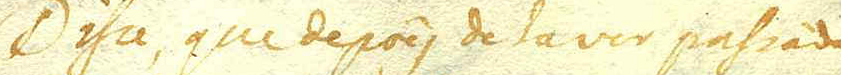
Disse, que depoês de la ver passado
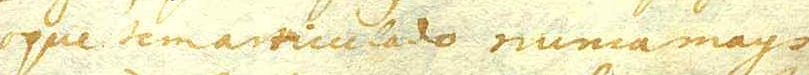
o que tem articulado nunca mays
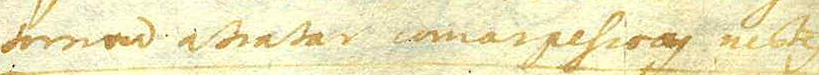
tornou a tratar com as pessoas nestes
